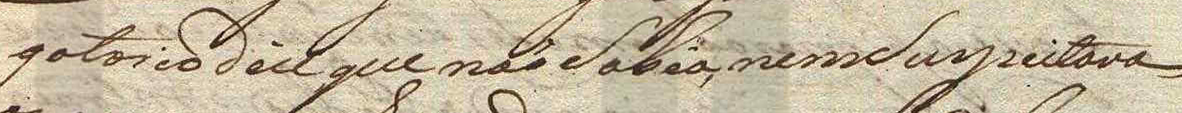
gatorio dice que naõ Sabia, nem Suspeitava
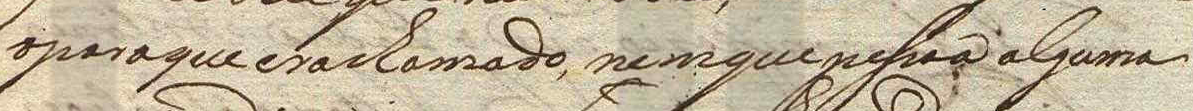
o para que era chamado, nem que pessoa alguma
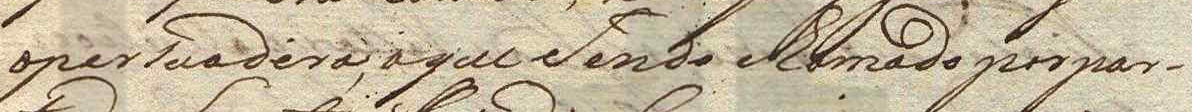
o persuadira, a que Sendo chamado por par
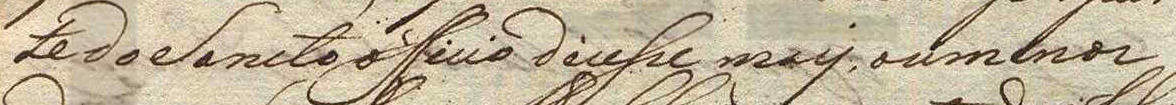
te do Sancto officio dicesse mais, ou menos
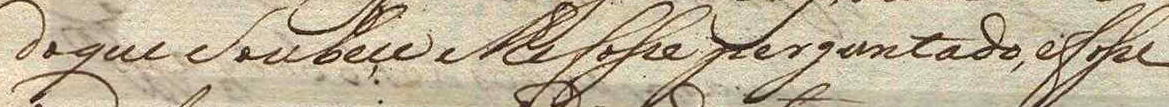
do que Soubeçe e lhe fosse perguntado, e fosse
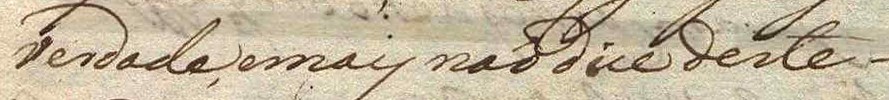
verdade, e mais naõ dice deste
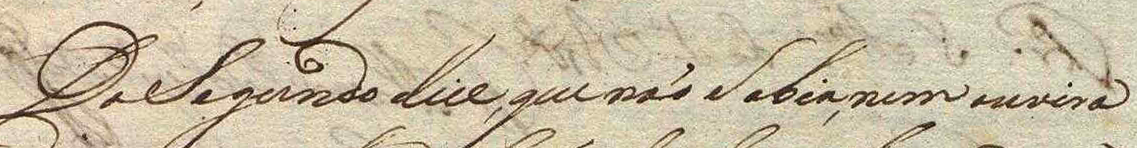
Do Segundo diçe, que naõ sabia, nem ouvira
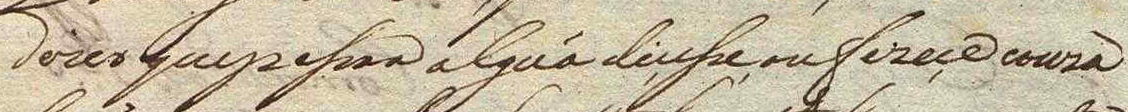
dizer que pessoa alguā diçesse, ou fizeçe couza
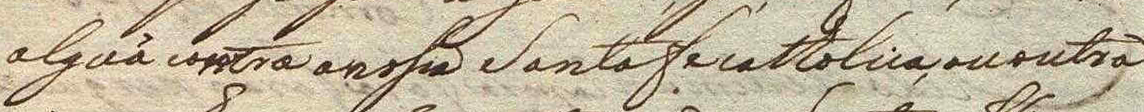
alguā contra a nossa Santa fe catholica, ou outra
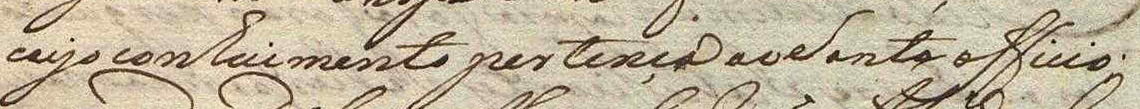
cujo conhecimento pertença ao Santo officio.
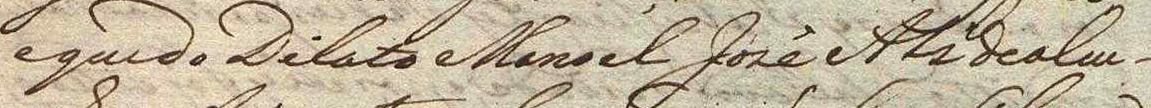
e que do Dilato Manoel Jozé Alz de alcu
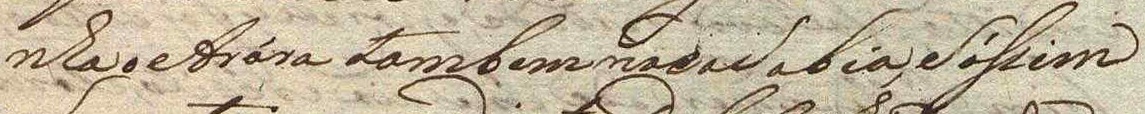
nha, o Arára tambem nao a Sabia, Sóssim
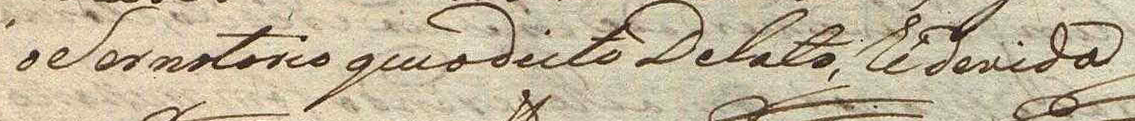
o Ser notorio que o dicto Delato, hé devida
